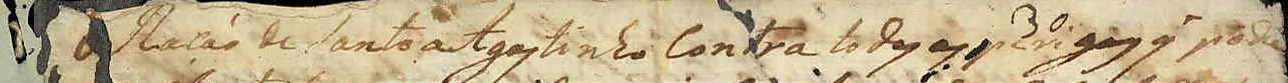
oRaçaõ de Santo aAgostinho Contra todos os perigos q̄ pode
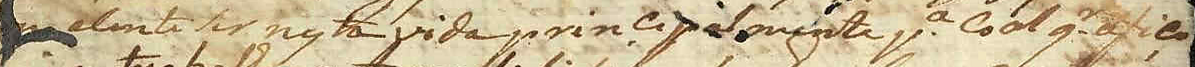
aconteser nesta vida prinçipalmente p.a coalq.r ofiço
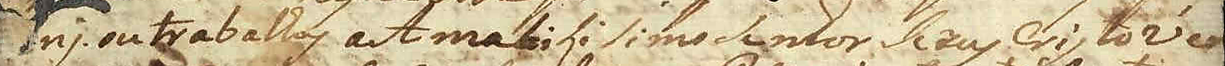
inj. ou trabalhos a Amabilisimo Senhor Iezus Cristo ver
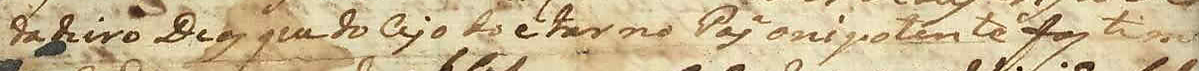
dadeiro Deos que do cejo do eterno Paj onipotente fas tem
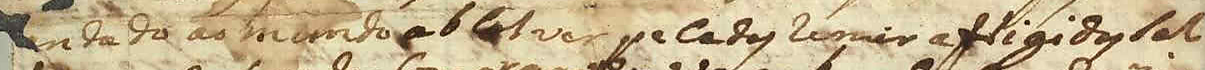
ndado as mando abColver pecados Remir afligidas sal
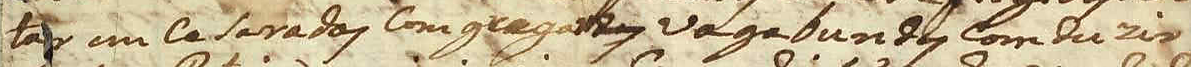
tar em casarados comgragados vagabundos comduzir
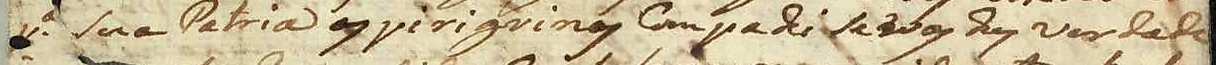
p.a sua Patria os pirigrinos Compadi sabeas das verdade
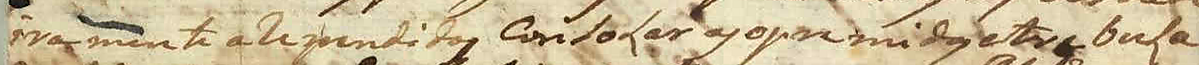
iramente aRependidos consoLar os opremidos e trebuLa
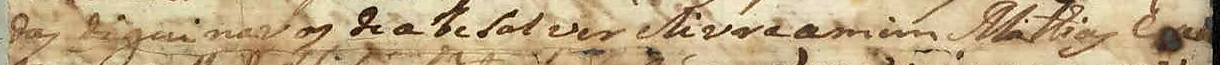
das digui novos de abesolver e livra a mim Mattias C
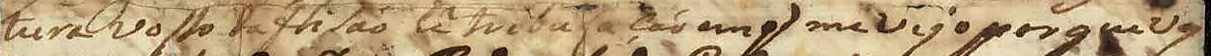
tura vosso da frisaõ hê trebuLaçaõ em q̄ me vejo porque vos
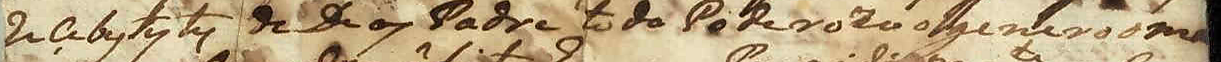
Reçebestes tes de Deos Padre todo Poderozo o genezo oma
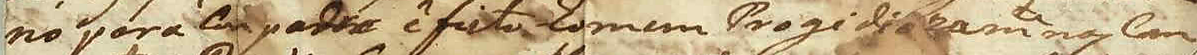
no para conpadre, ê feito homem Progidiozam.te nos Com
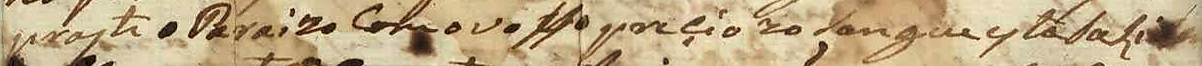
praste o Paraizo Com o vosso preçiozo sangue está saLi
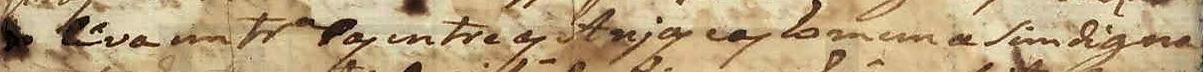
Lêva em tr.a Pay entre os Anjos e os homem asim digno
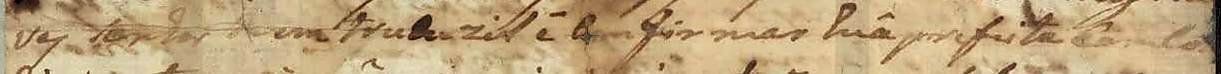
vos senhor de em trudezir e comfirmar huā prefeita ComCo
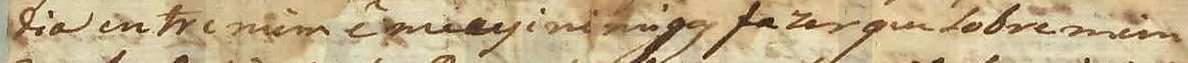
dia entre mim ê meus inimigos fazer que sobre mim
